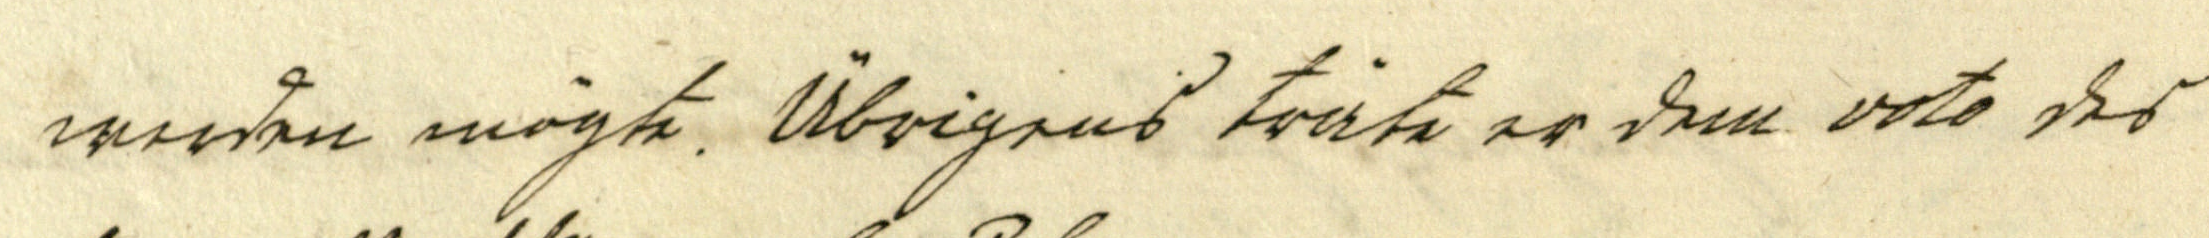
werden mögte. Übrigens träte er dem voto des
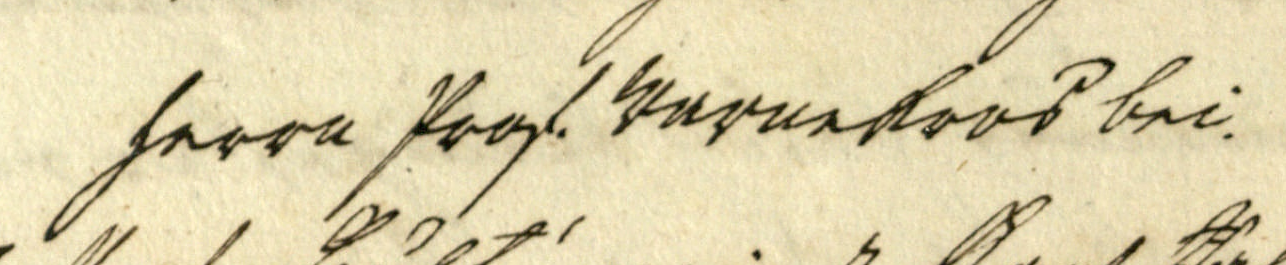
herrn Prof. Warnekros bei.
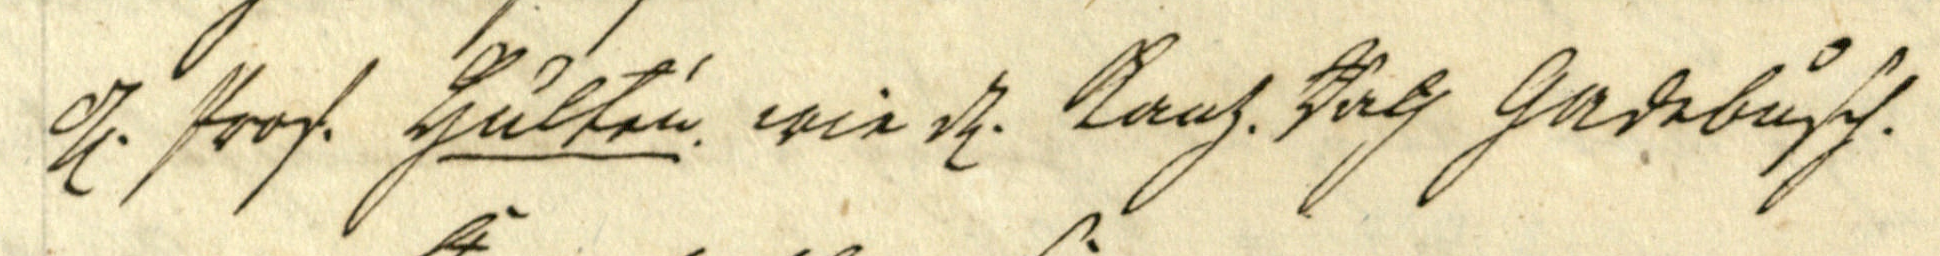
dh. Prof. Hultén, wie dh. Kanz. Rath Gadebusch.
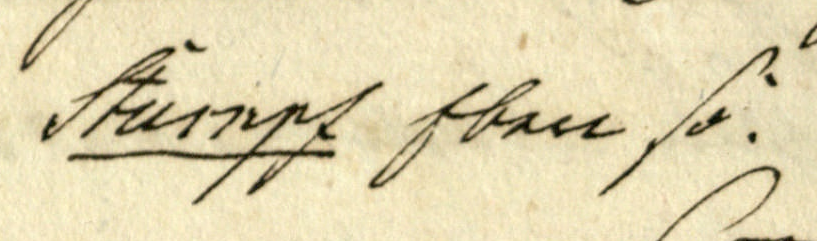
Stumpf Eben so.
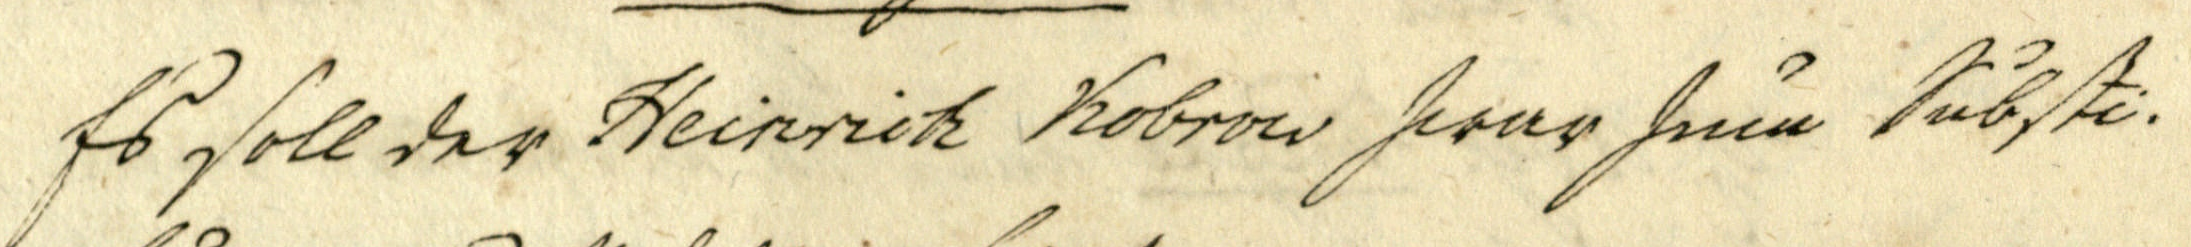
Es soll der Heinrich Kobrow zwar zum Substi¬
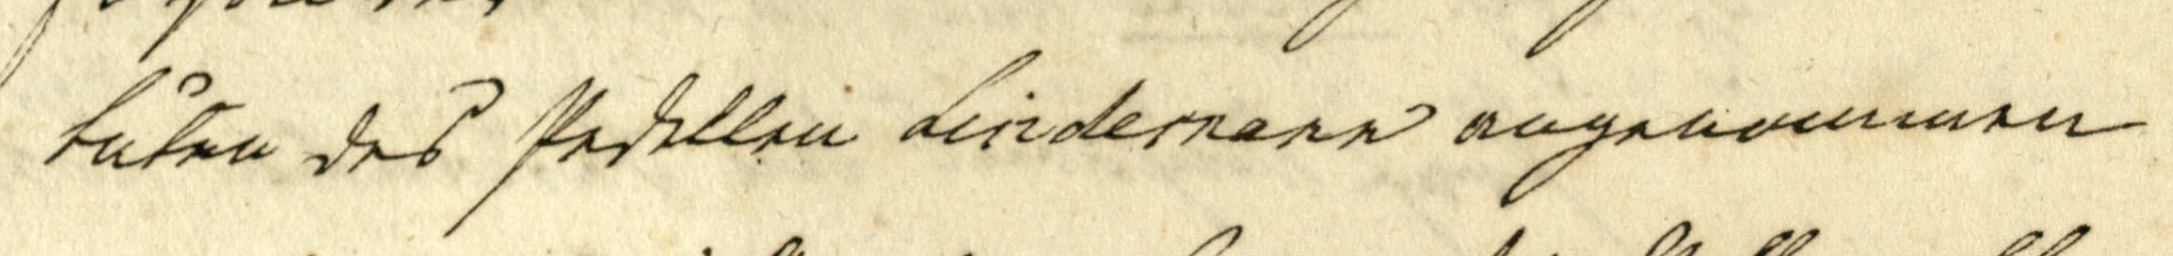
tuten des Pedellen Lindemann angenommen
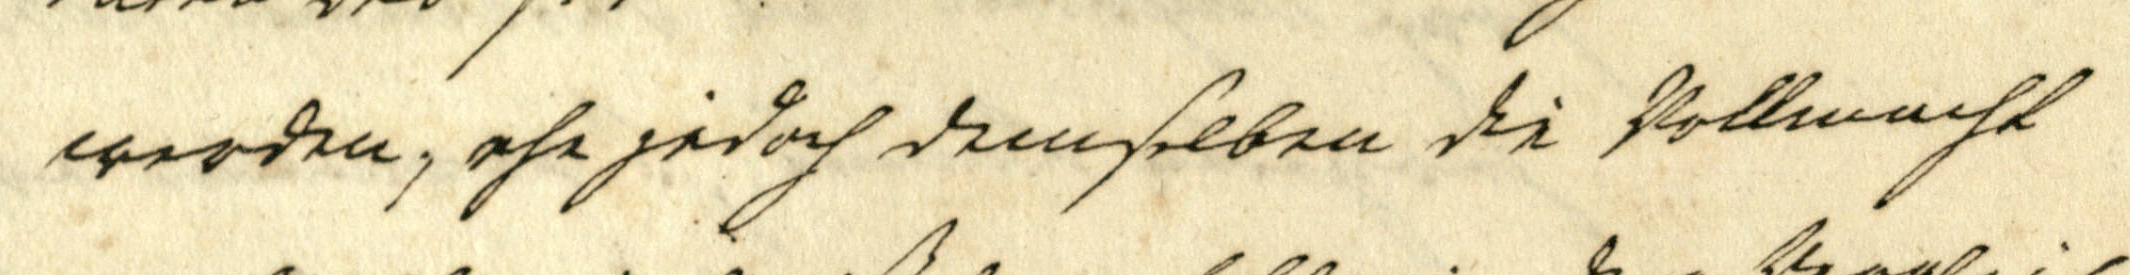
werden, ehe jedoch demselben die Vollmacht
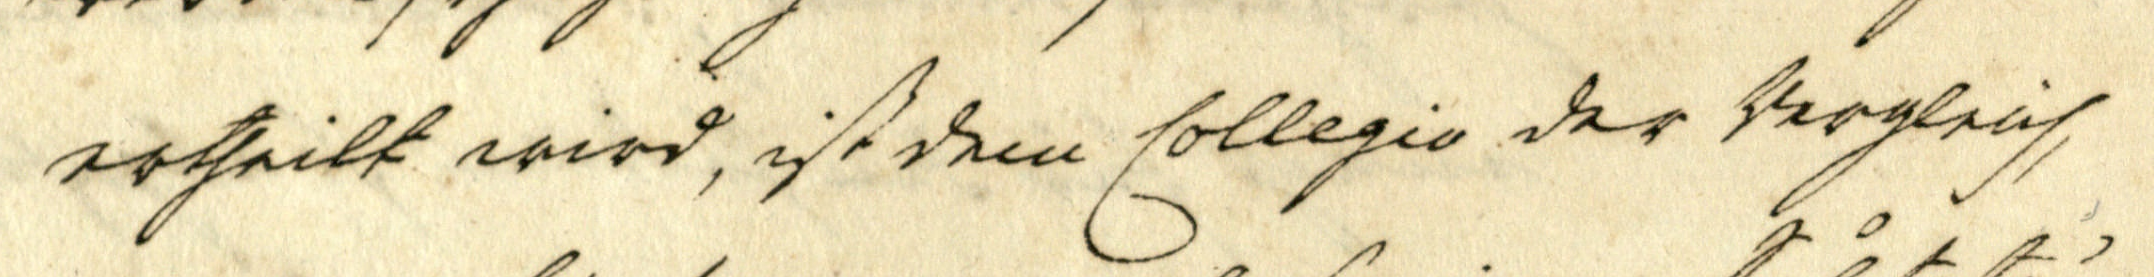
ertheilt wird, ist dem Collegio der Vergleich,
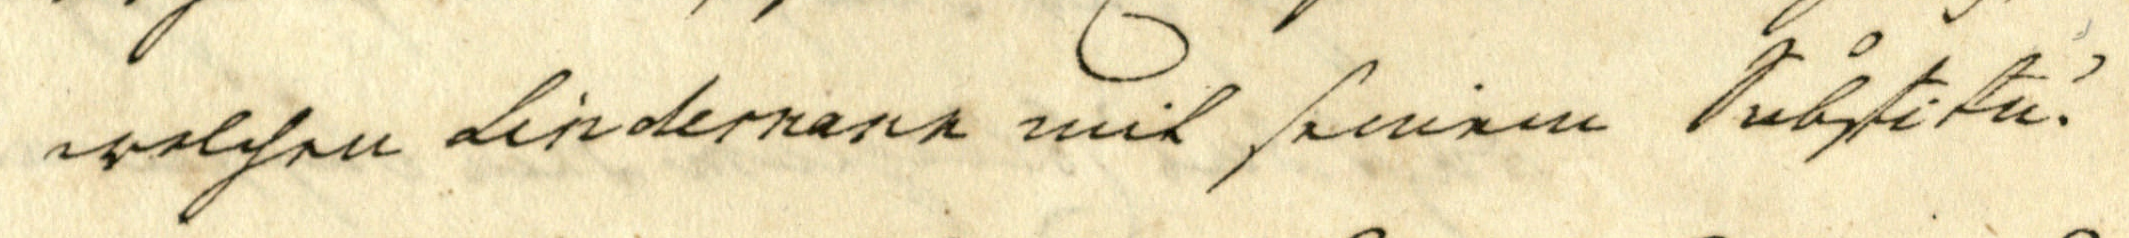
welchen Lindemann mit seinem Substitu¬
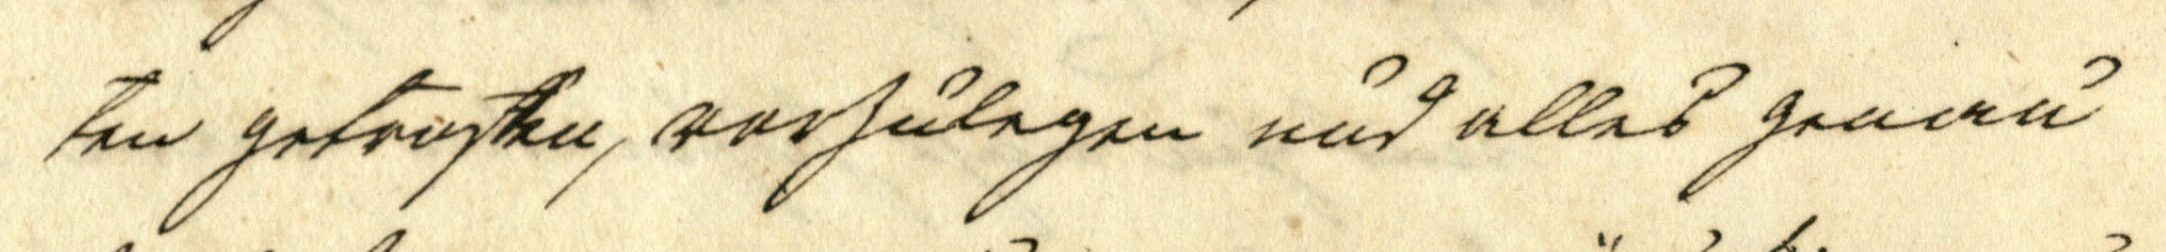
ten getroffen, vorzulegen und alles genau
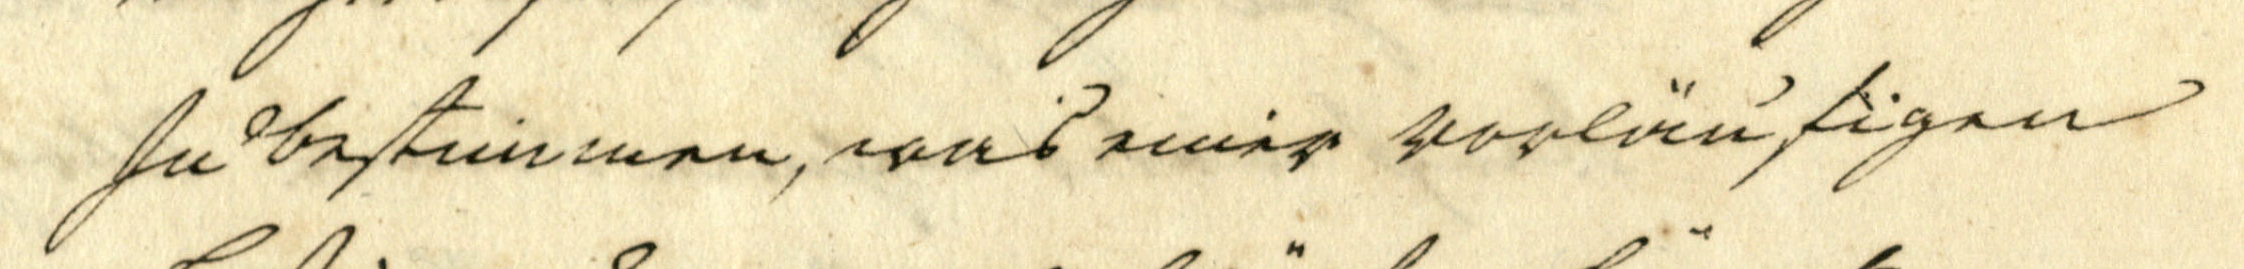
zubetimmen, was einer vorläufigen
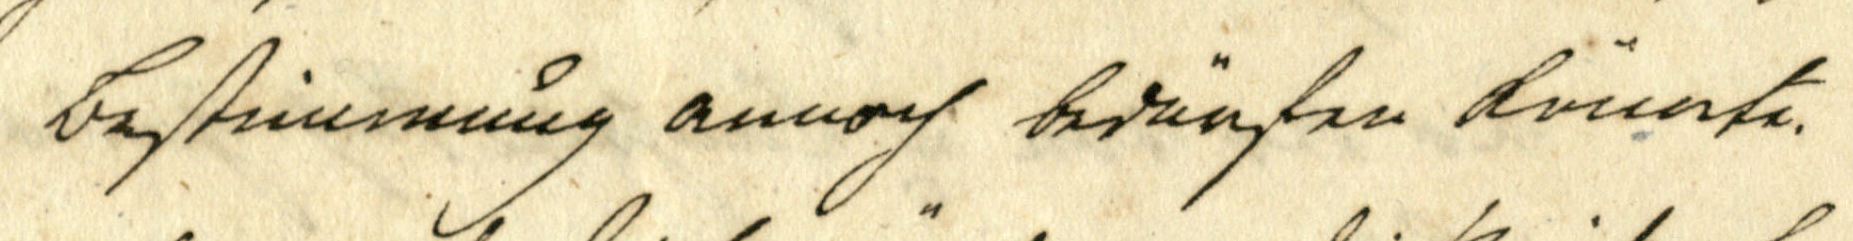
Bestimmung annoch bedürfen könnte.
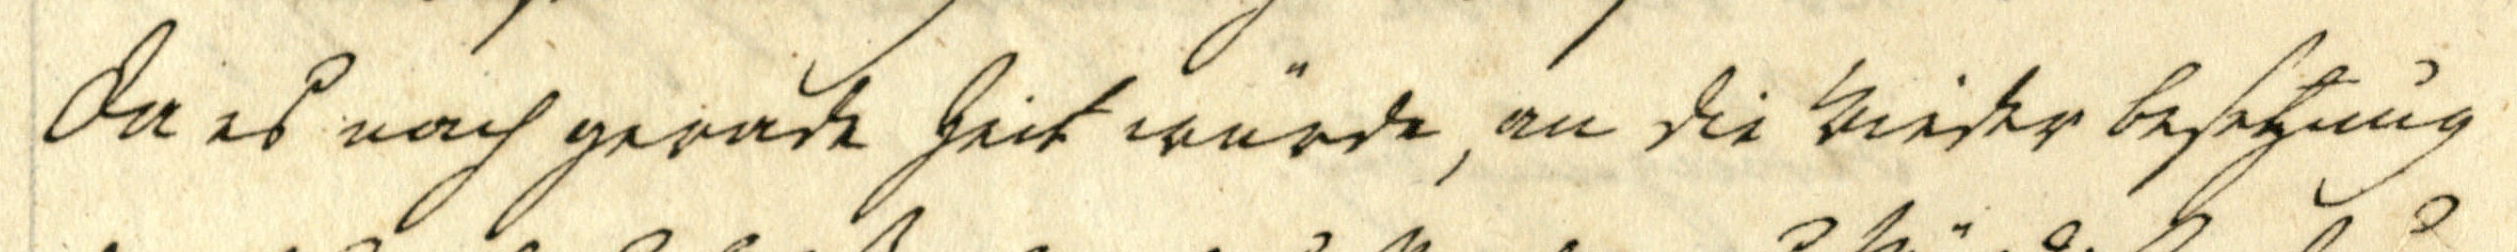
Da es nach gerade Zeit würde, an die Wieder besetzung
